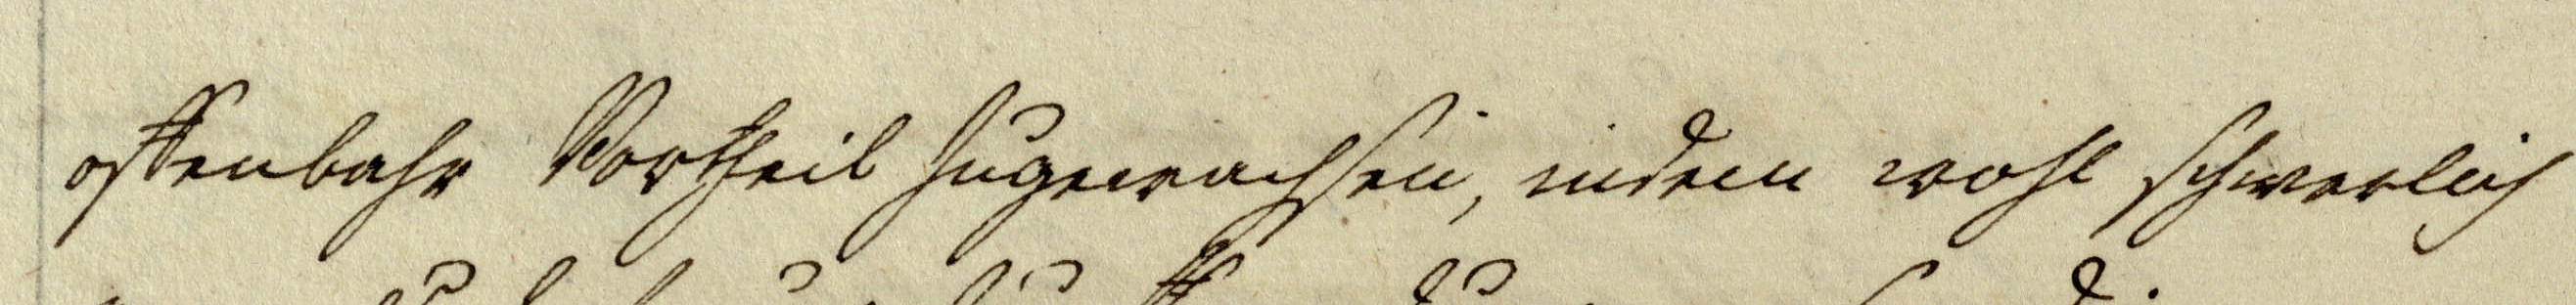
offenbahr Vortheil zugewachsen, indem wohl schwerlich
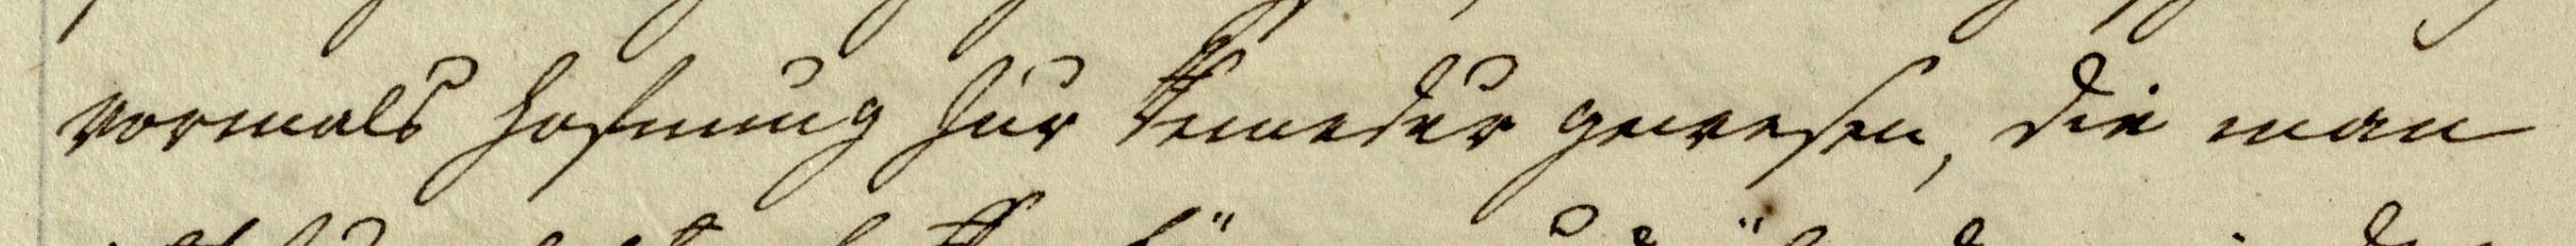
vormals Hofnung zur Remedur gewesen, die man
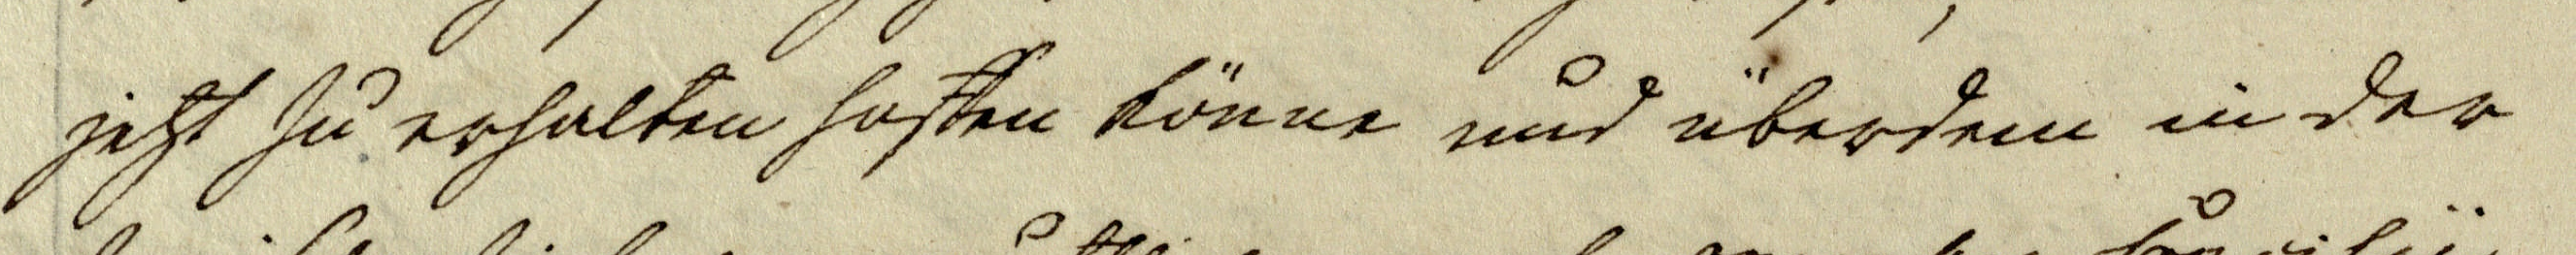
jetzt zu erhalten hoffen könne und überdem in der
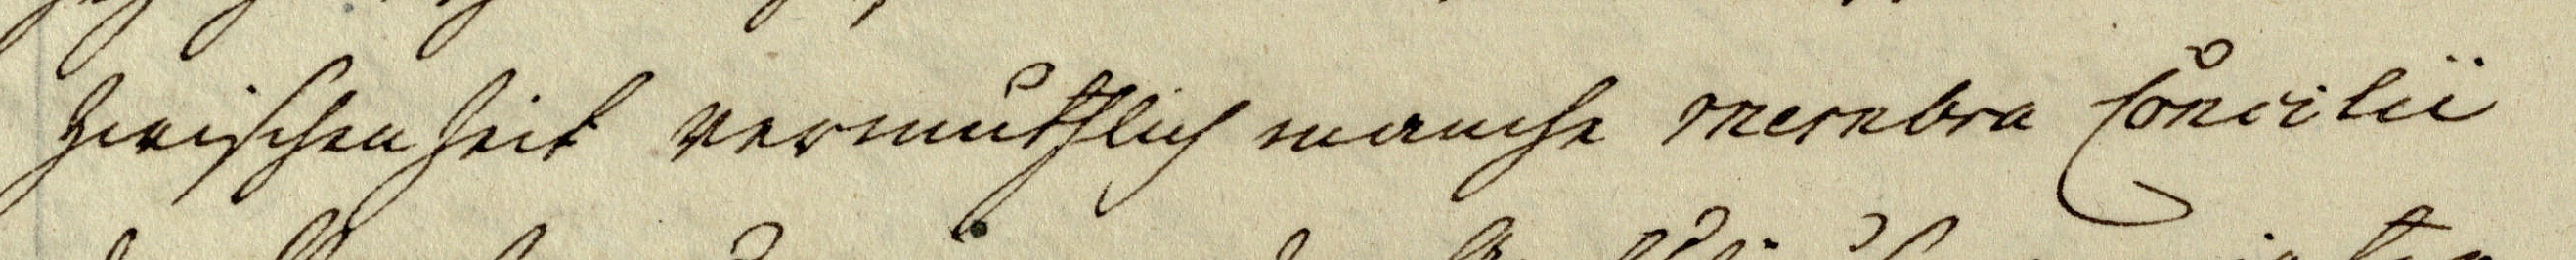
Zwischenzeit vermuthlich manche membra Concilii
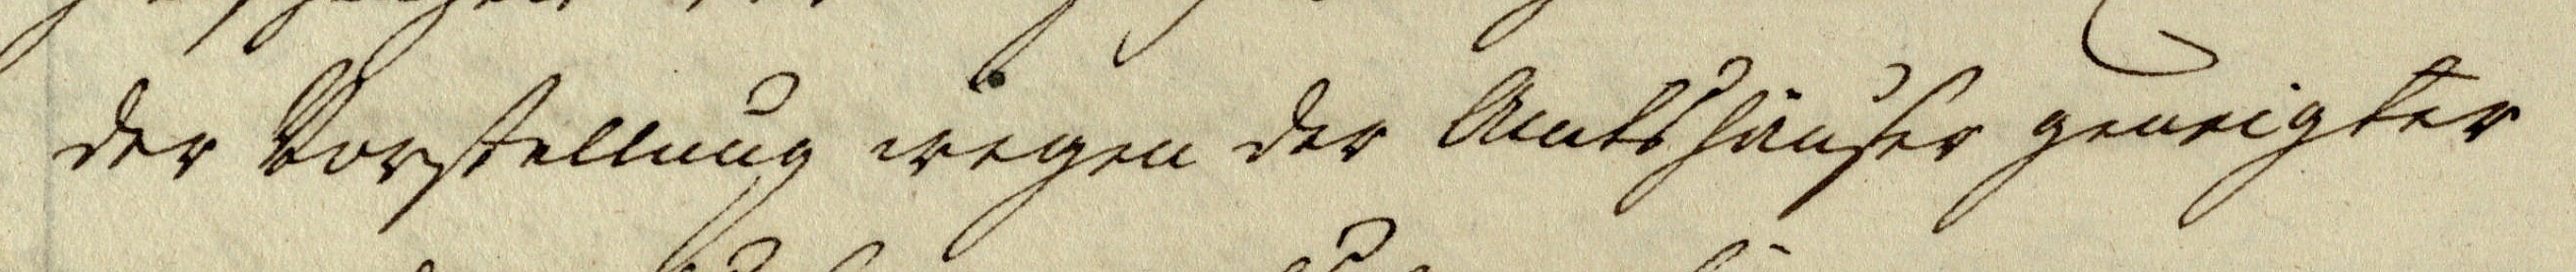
der Vorstellung wegen der Amtshäuser geneigter
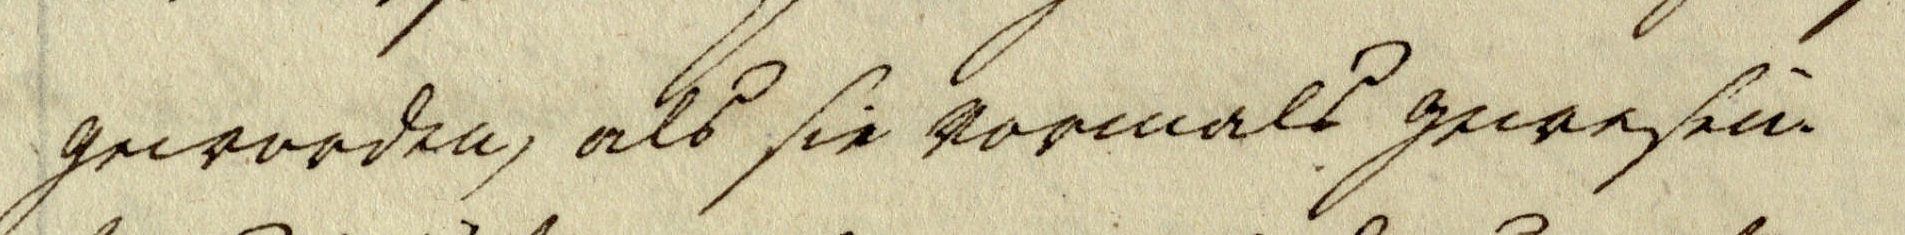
geworden, als sie vormals gewesen.
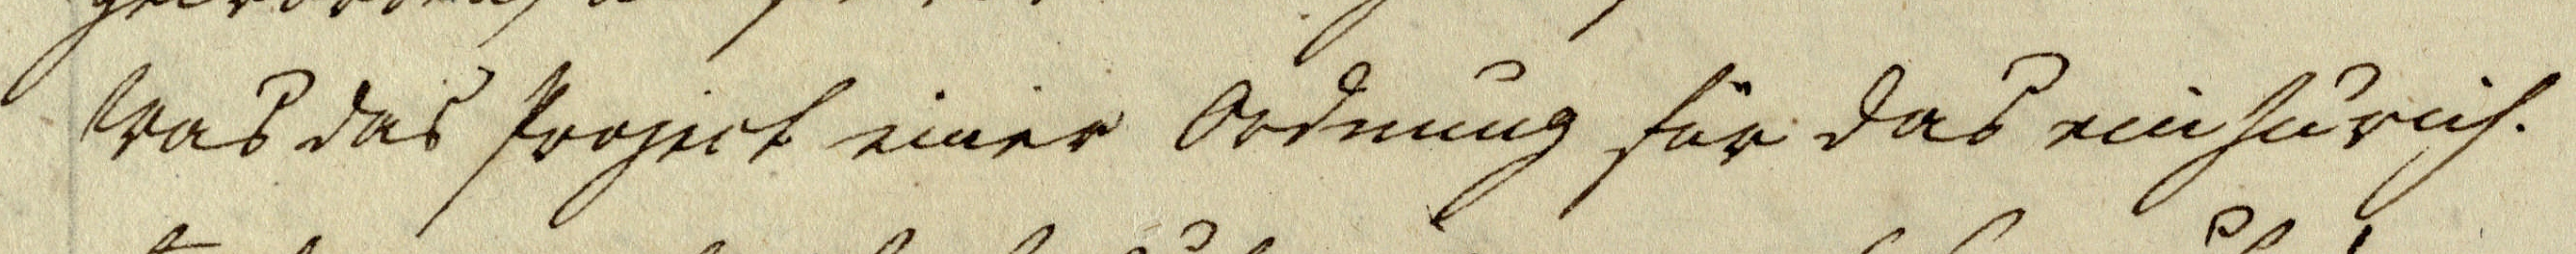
Was das Project einer Ordnung für das einzurich¬
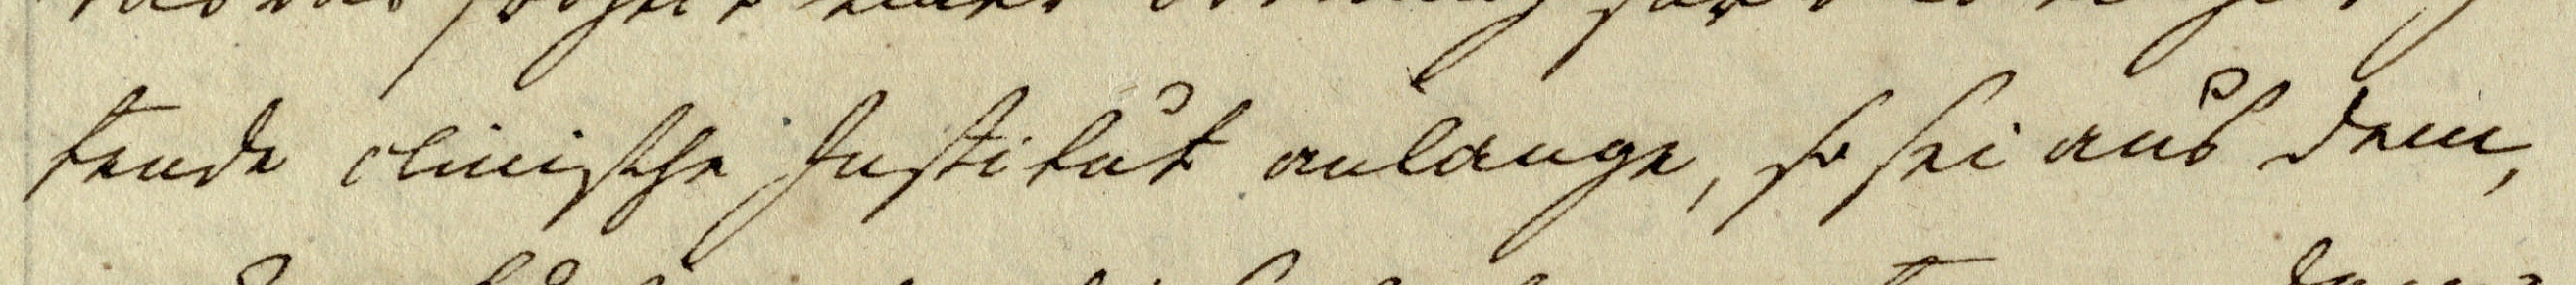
tende clinische Institut anlange, so sei aus dem,
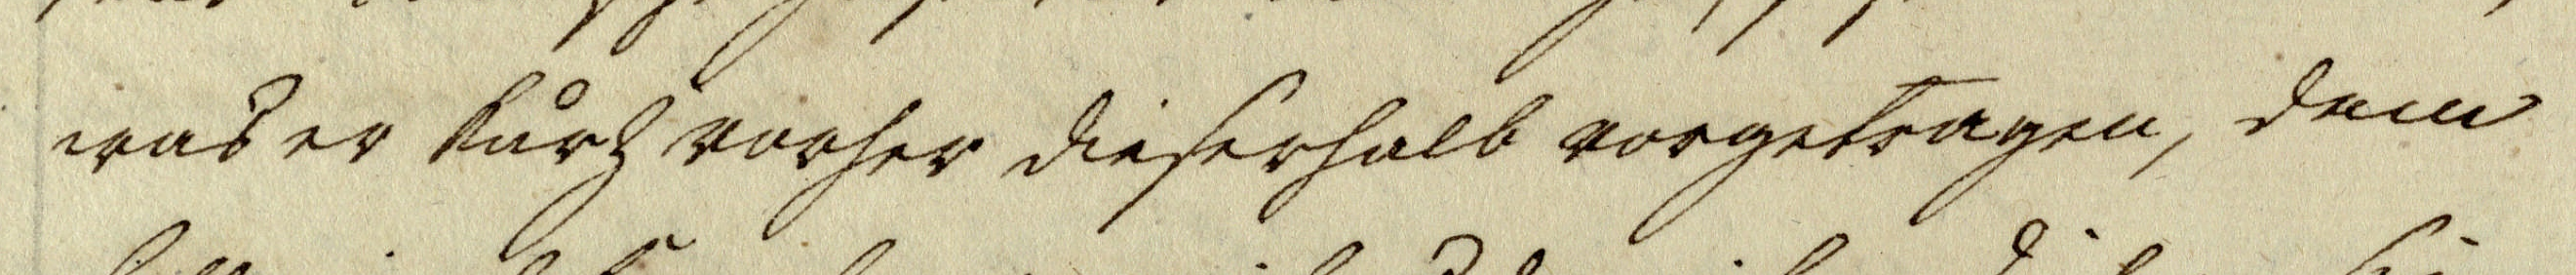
was er kurz vorher dieserhalb vorgetragen, dem
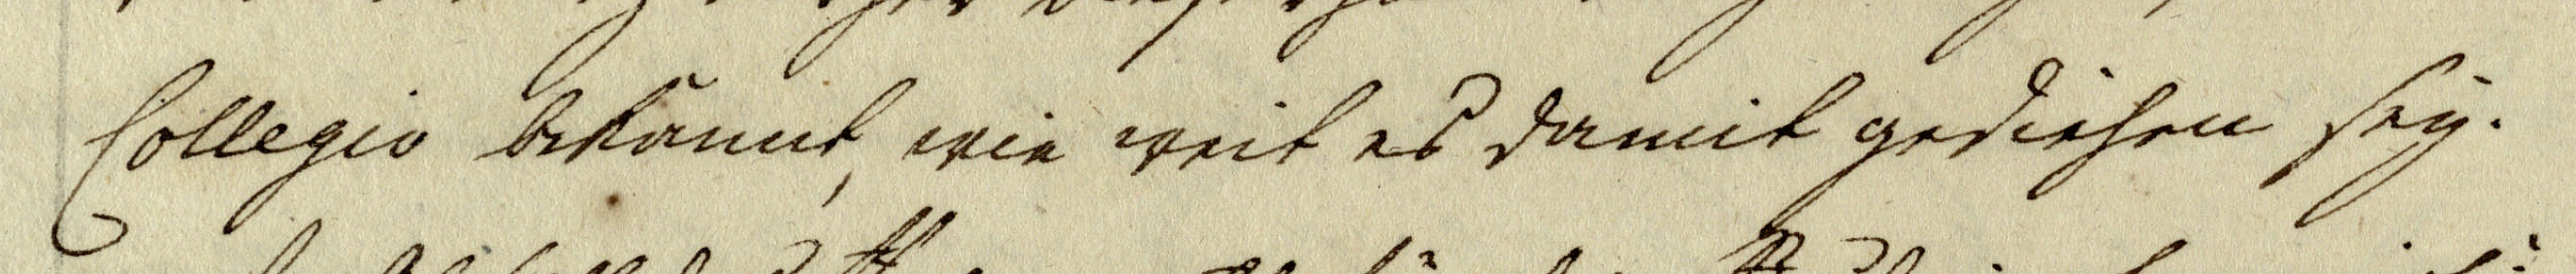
Collegio bekannt, wie weit es damit gediehen seÿ.
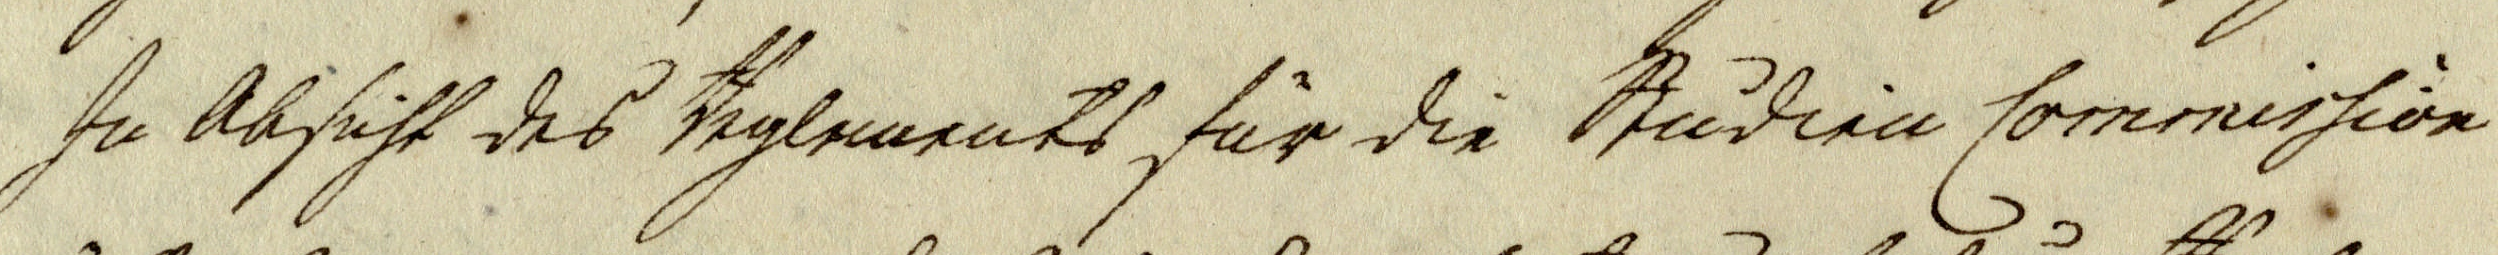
In Absicht des Reglements für die Studien Commission
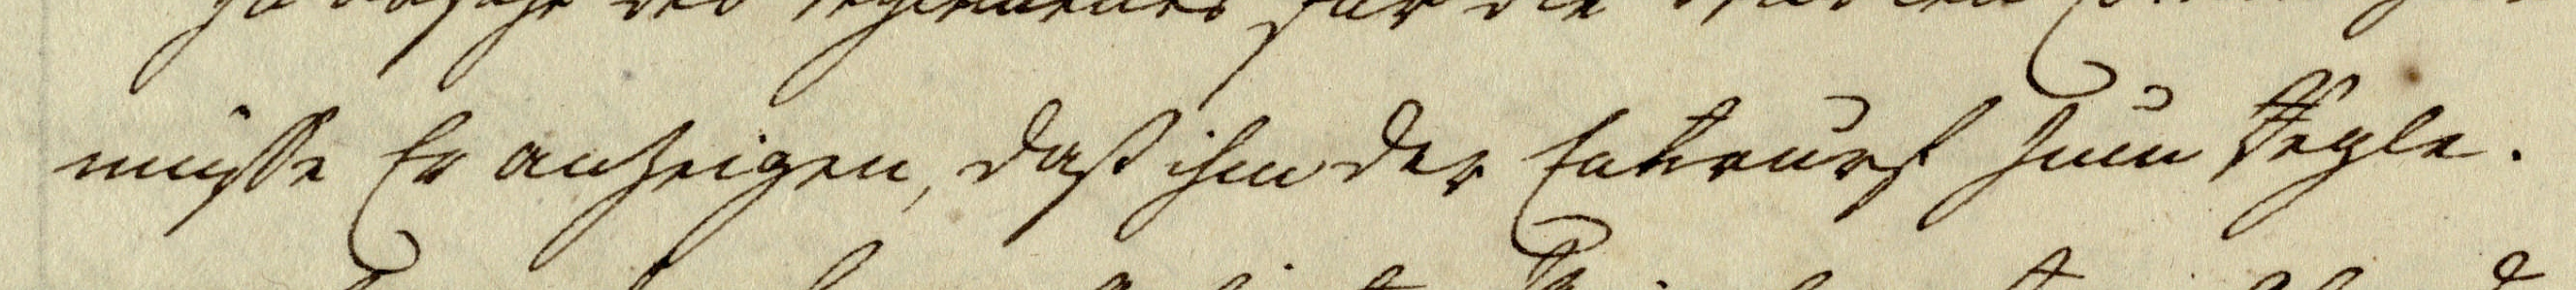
müsse Er anzeigen, daß ihm der Entwurf zum Regle¬
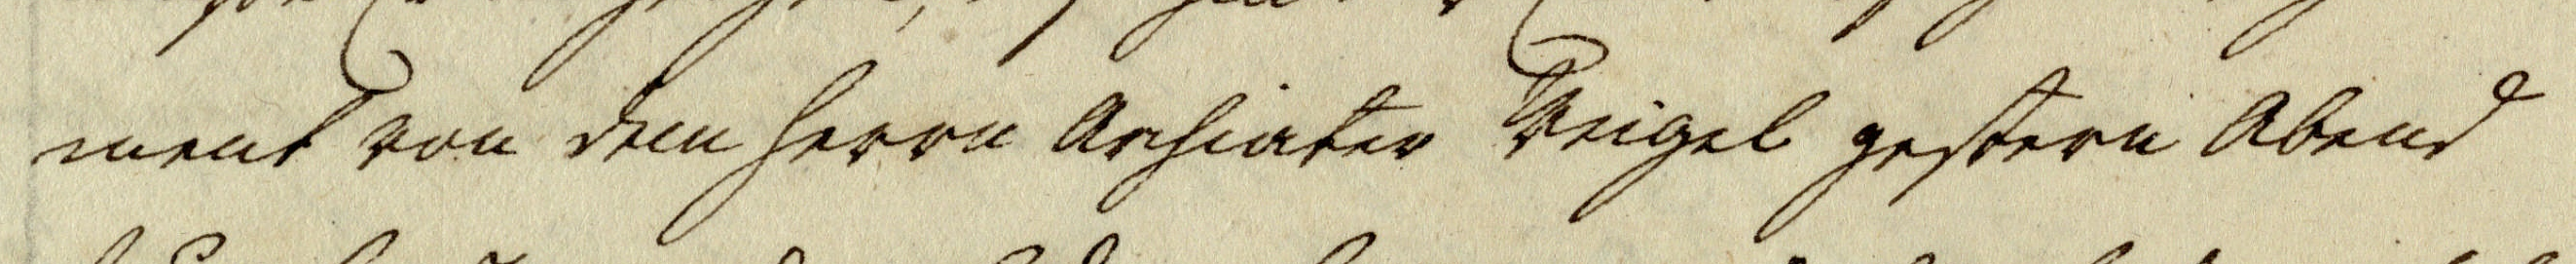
ment von dem Herrn Archiater Weigel gestern Abend
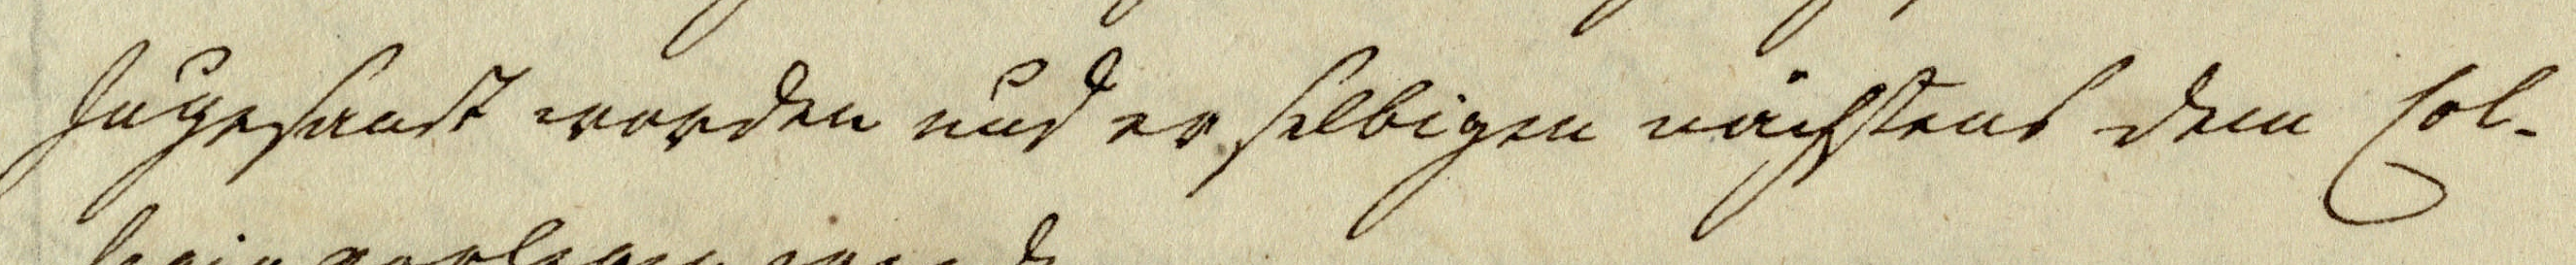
zugesandt worden und er selbigen nächstens dem Col¬
